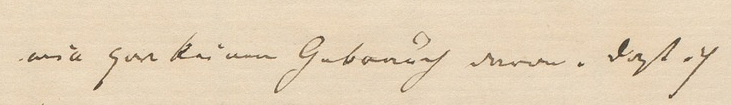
wie gar keinen Gebrauch davon. Daß ich
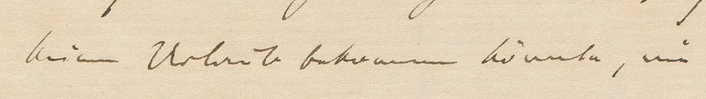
keinen Urlaub bekommen könnte, wie
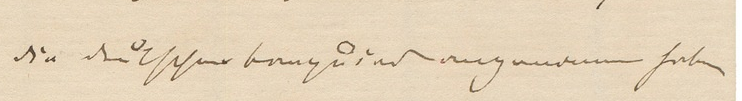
die deutschen Banquiers angenommen haben
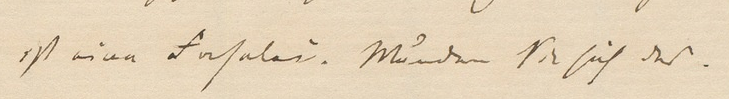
ist eine Faselei. Wundern Sie sich des-
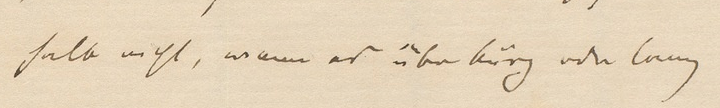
halb nicht, wenn es über kurz oder lang
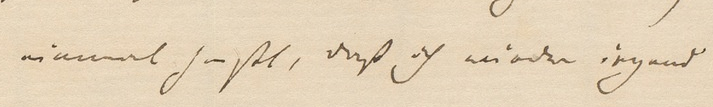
einmal heißt, daß ich wieder irgend
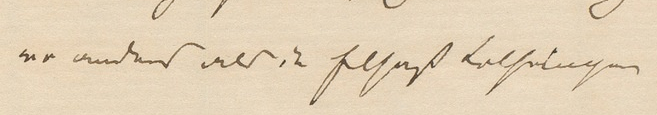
wo anders als in Elsaß Lothringen
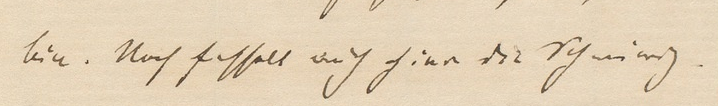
bin. Noch fesselt auch hier die Schwierig-
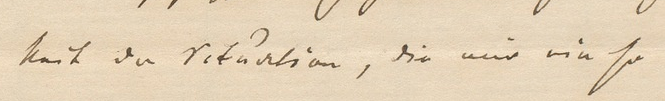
keit der Situation, die mir ein so
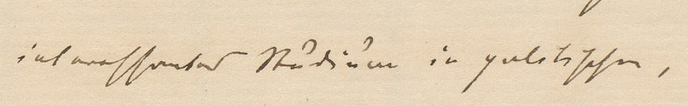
interessantes Studium in politischen,
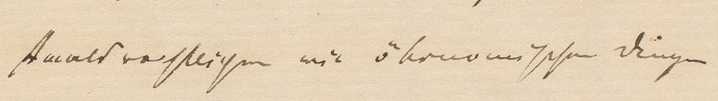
staatsrechtlichen wie ökonomischen Dingen
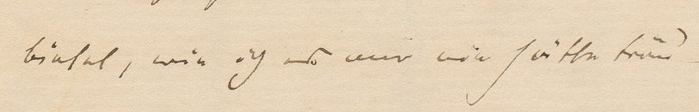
bietet, wie ich es mir nie hätte träu-
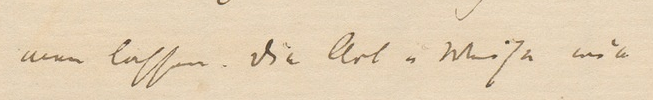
men lassen. Die Art u Weise wie
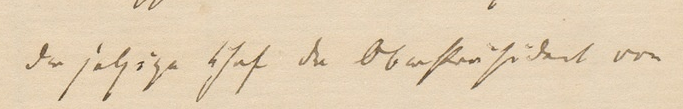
der jetzige Chef der OberPräsident von
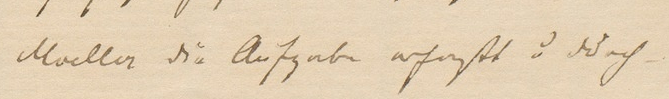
Moeller die Aufgabe erfaßt u durch-
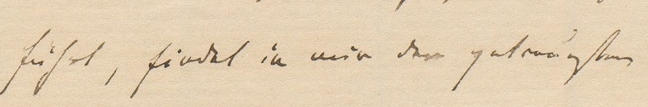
führt, findet in mir den getreuesten
